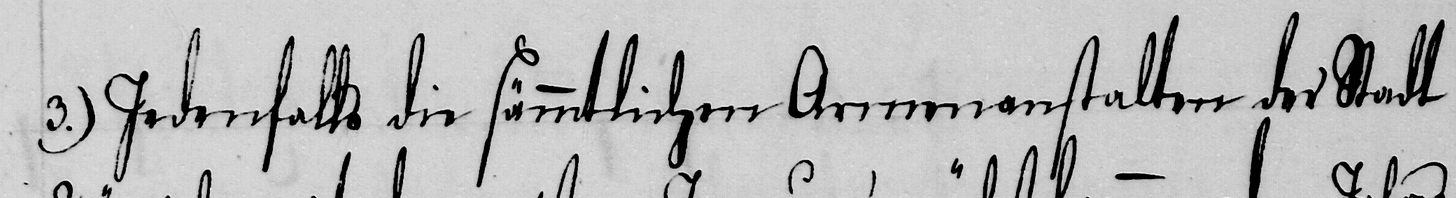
3.) Jedenfalls die sämmtlichen Armenanstalten der Stadt
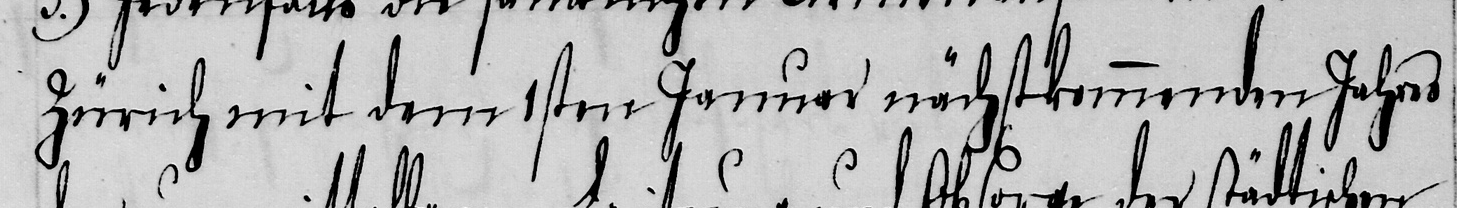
Zürich mit dem 1sten Januar nächstkommenden Jahres
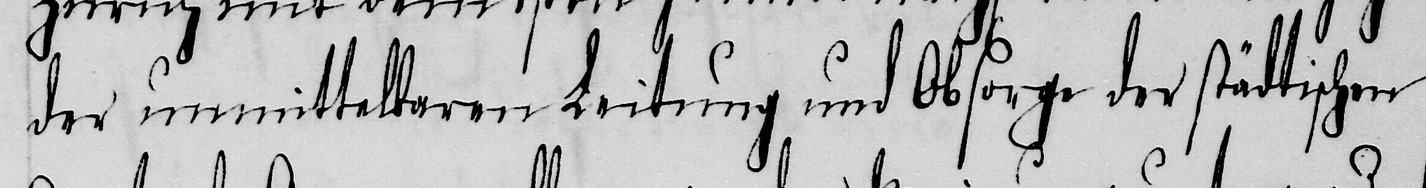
der unmittelbaren Leitung und Absorge der städtischen
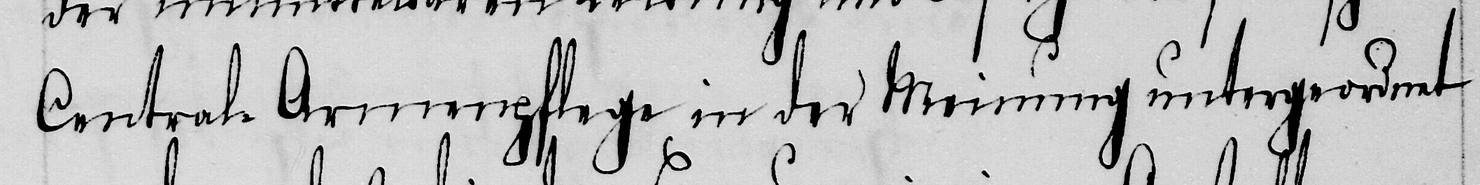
Central-Armenpflege in der Meinung untergeordnet
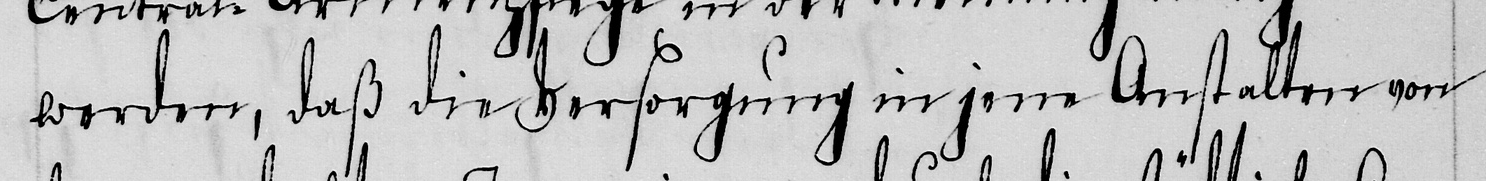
werden, daß die Versorgung in jene Anstalten von
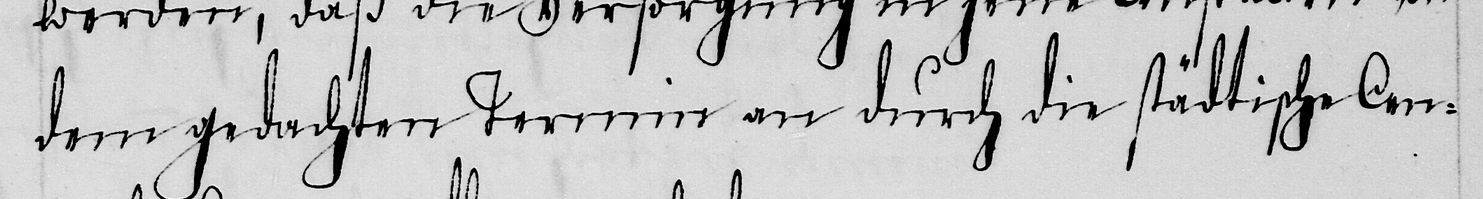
dem gedachten Termin an durch die städtische Cen¬
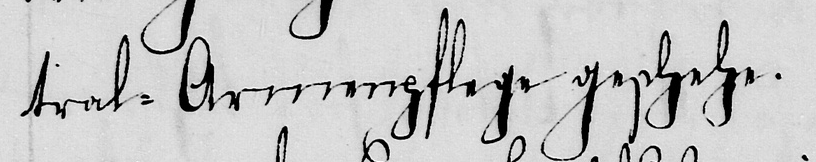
tral-Armenpflege geschehe.
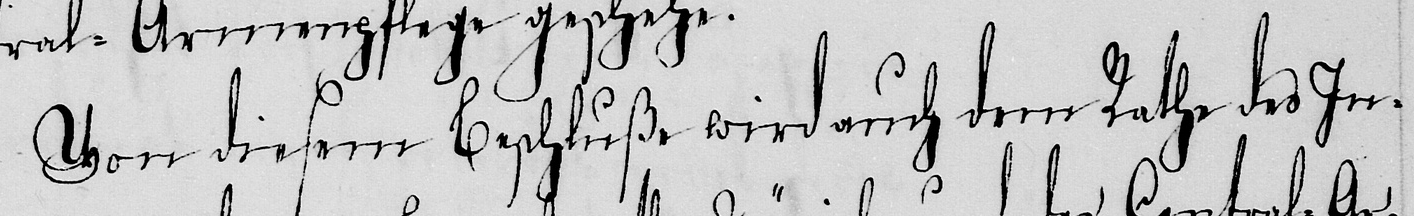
Von diesem Beschluße wird auch dem Rathe des In¬
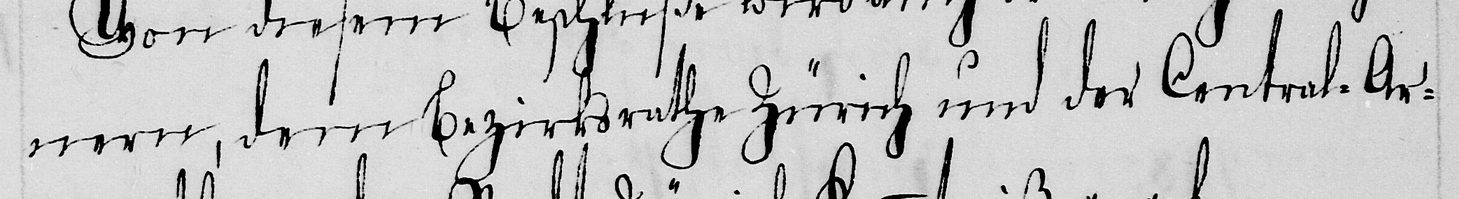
nern, dem Bezirksrathe Zürich und der Central-Ar¬
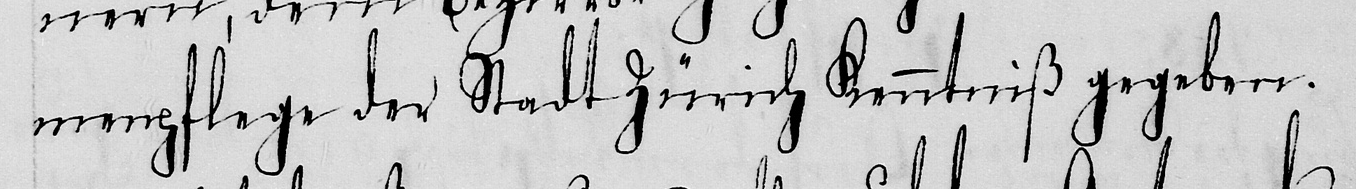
menpflege der Stadt Zürich Kenntniß gegeben.
